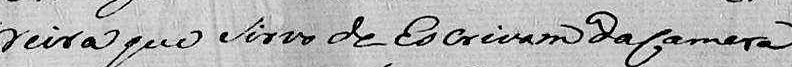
reira que sirvo de Escrivam da Camera
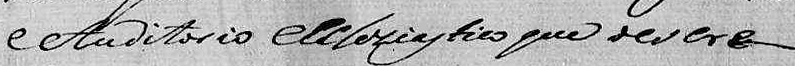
e Auditorio eccleziastico que o escre
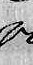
vi
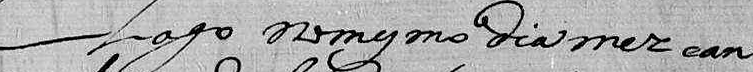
E Logo no mesmo dia mez e an
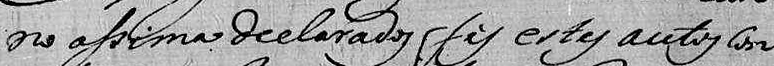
no assima declarados fis estes autos con
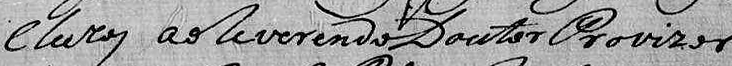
Cluzos ao Reverendo Doutor Provizor
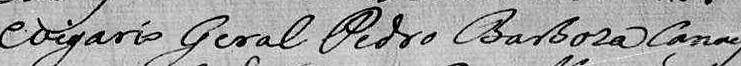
e vigario Geral Pedro Barboza Canais
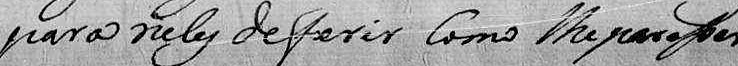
para neles deferir Como lhe paresser
